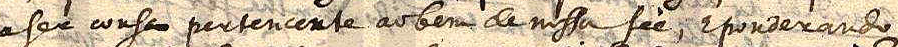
a ser cousa pertencente ao bem de nossa fee, E ponderando
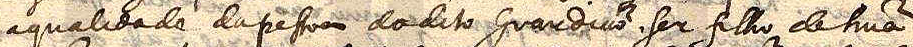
a qualidade da pessoa do dito Goardiaõ. ser filho de huā
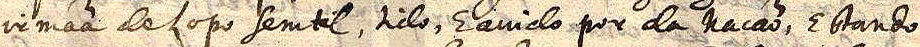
irmaā de lopo semtil, tido, E auido por da nacaõ, Estando
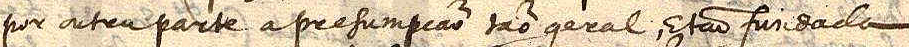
por outra parte a presumpcaõ taõ geral; E taõ fundada
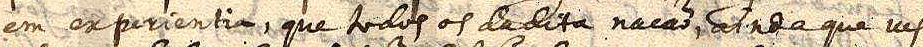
em experientia, que todos os da dita nacaõ, ainda que ues
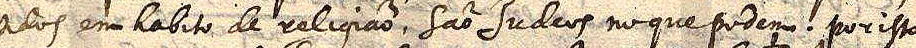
tidos em habito de religiaõ, saõ Judeos no que podem. por isso
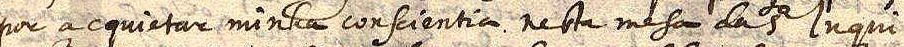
por acquietar minha conscientia nesta mesa da sta Inqui
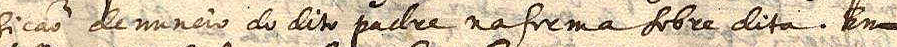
sicaõ denuncio do dito padre na forma sobredita. Em
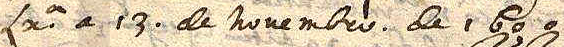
Lx.a a 13. de nouembro. de 1600
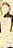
R
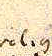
relig
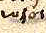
iosos
